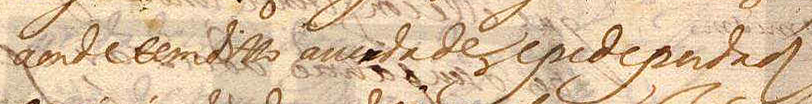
aonde tem ditto a uerdade e pede perdaõ
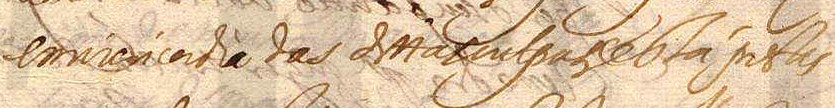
e mizericordia das dittas culpas e está prestes
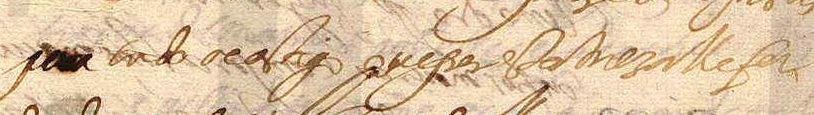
pera tudo o castigo que por esta meza lhe for
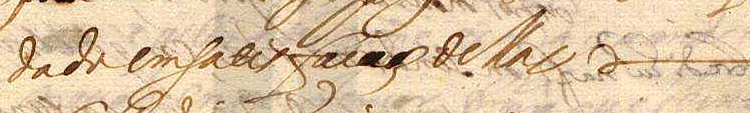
dado em satisfaçaõ della //
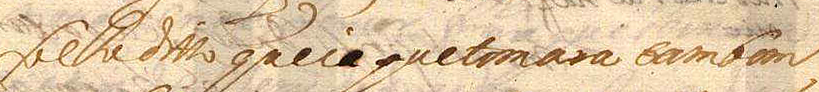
foelhe ditto que ia que tomara tam bom
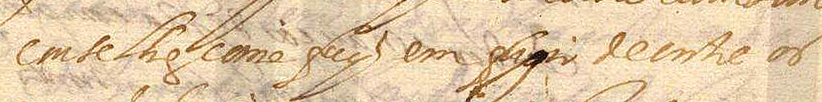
conselho como fuy em fugir de entre os
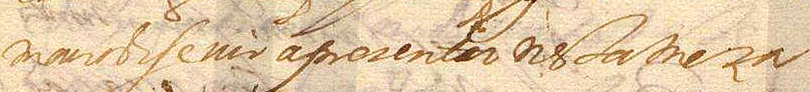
mouros e se uir aprezentar nesta meza
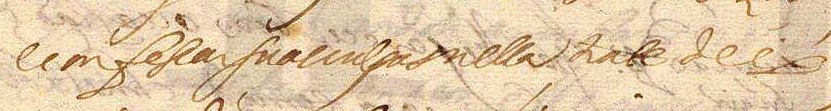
e confessar suas culpas nella trate de ex
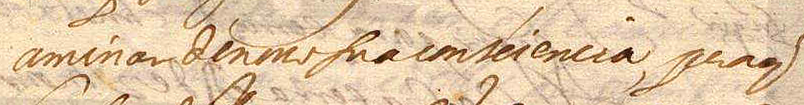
aminar de nouo sua consciencia, pera q̄
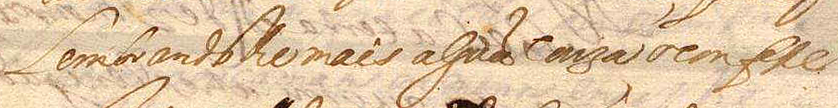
Lembrandolhe mais alguā couza o confesse
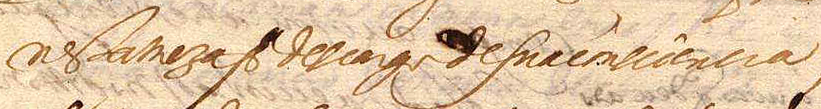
nesta meza pa descargo de sua consciencia
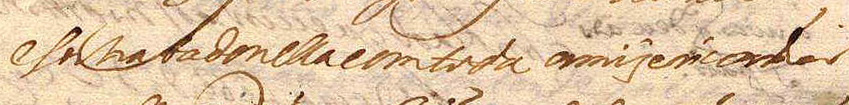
e ser tratado nella com toda a mizericordia
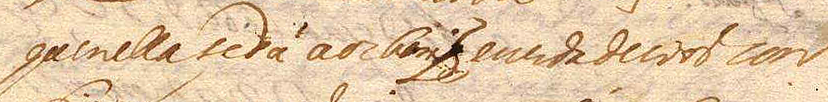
que nella se dá aos boms e uerdadeiros con
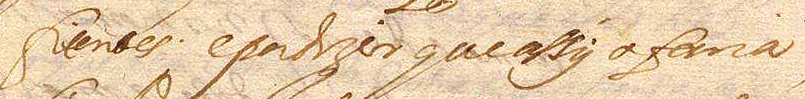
fitentes. e por dizer que assy o faria
